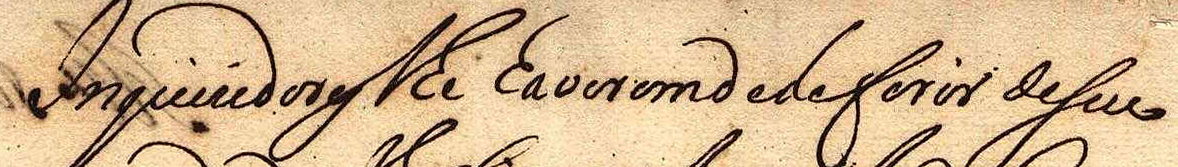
Inquisidores lhe haverem de deferir de seu
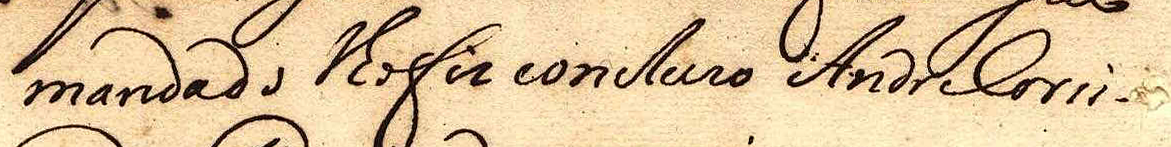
mandado lho fiz concluzo Andre Corsi
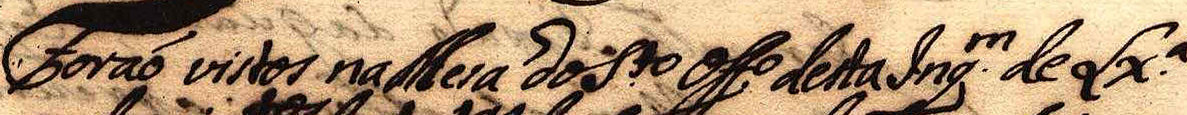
Foraõ vistos na Mesa do S.to Off.o desta Inq.m de Lx.a
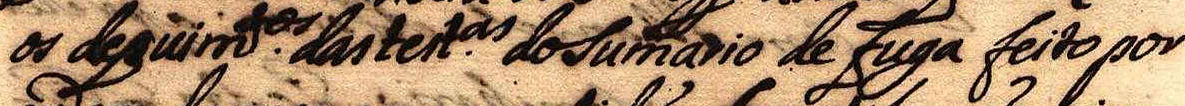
os depuim.tos das test.as do Sumario de fuga feito por
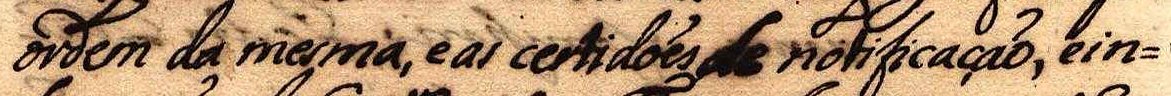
ordem da mesma, e as certidoẽs de notificaçaõ, e in
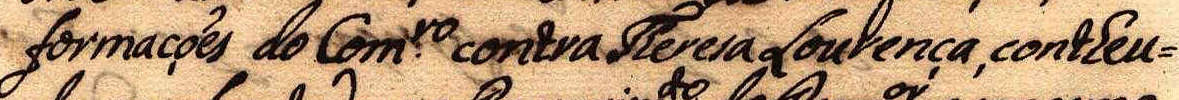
formaçoẽs do Com.ro contra Theresa Lourença, contheu
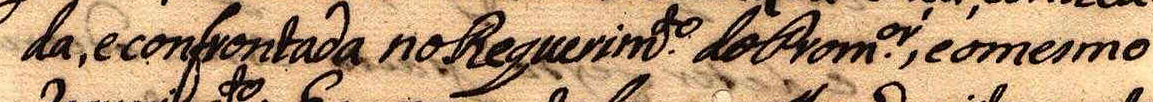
da, e confrontada no Requerim.to do Prom.or, e o mesmo
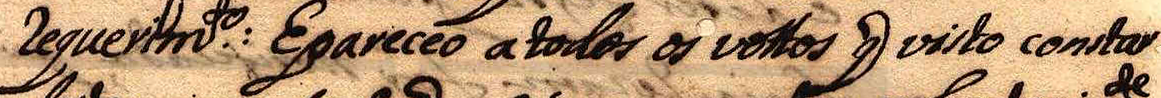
Requerim.to: E pareceo a todos os vottos q̄ visto constar
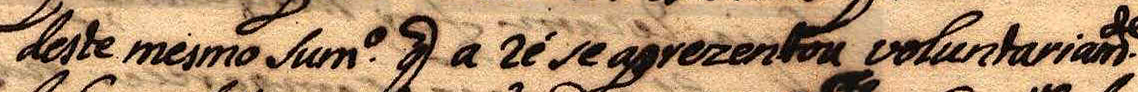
deste mesmo Sumo. q̄ a ré se aprezentou voluntariam.te
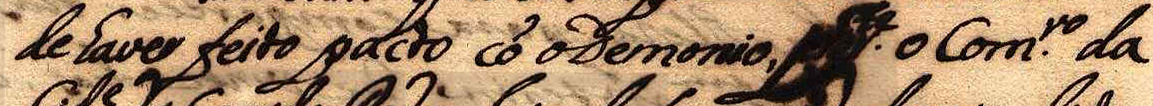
de haver feito pacto cō o Demonio p.te o Com.ro da
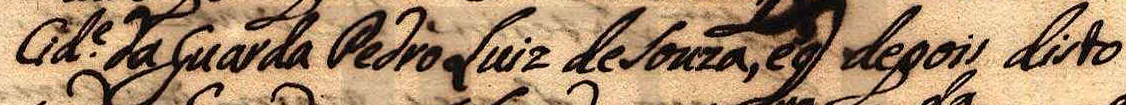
Cid.e da Guarda Pedro Luiz de Souza, e q̄ depois disto
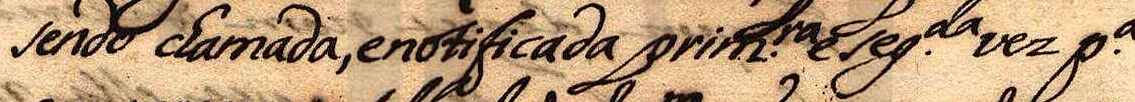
sendo chamada, e notificada prim.ra e seg.da vez p.a
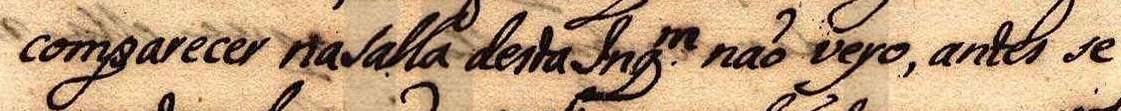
comparecer na salla desta Inq.m naõ veyo, antes se
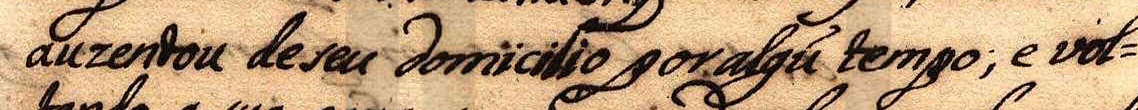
auzentou de seu domicilio por algū tempo; e vol
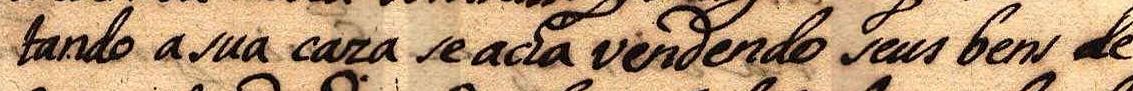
tando a sua caza se acha vendendo seus bens de
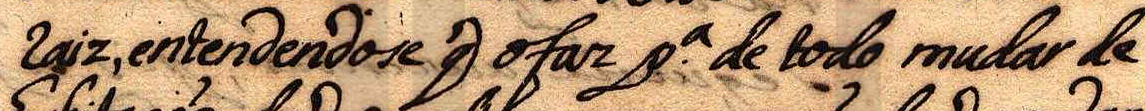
raiz, entendendose q̄ o faz p.a de todo mudar de
